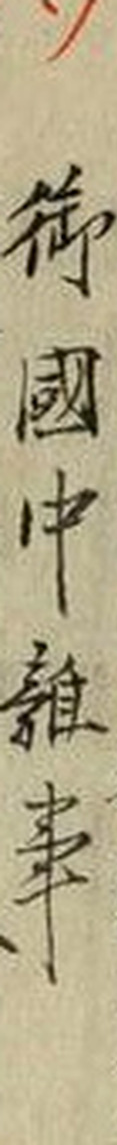ソ御国中雑事
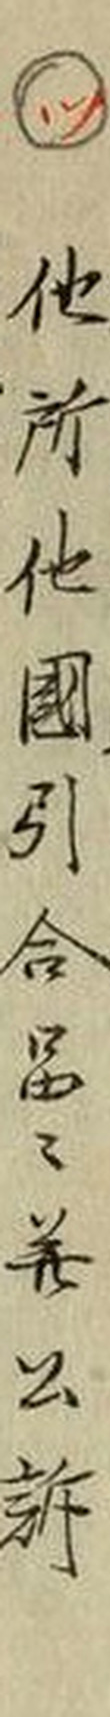ツ他所他国引合品々幷公訴
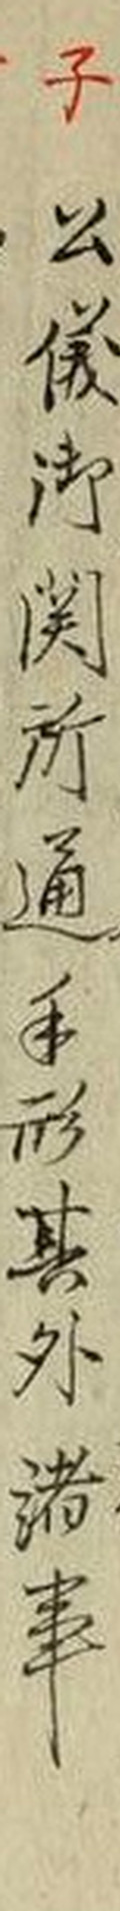子公儀御関所通手形其外諸事
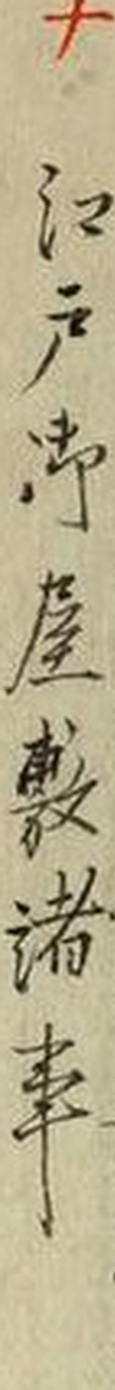ナ江戸御屋敷諸事
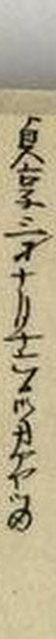貞享三寅十月十六日御用部ヤ留
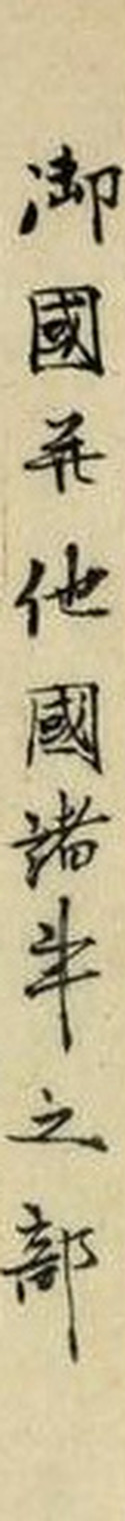御国幷他国諸事之部
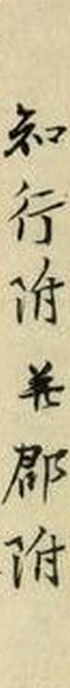知行附幷郡附
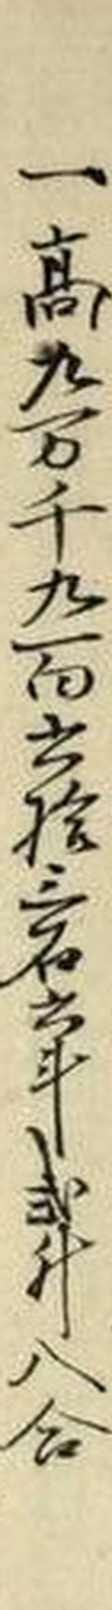一高九万千九百六拾三石六斗弐升八合
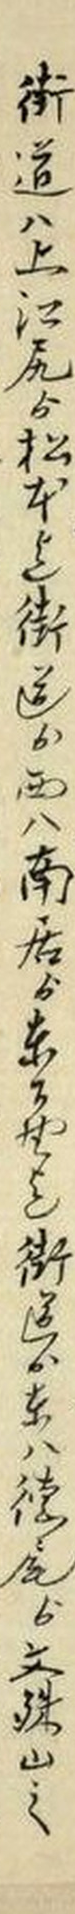街道ハ上江尻ゟ松本迄街道ゟ西ハ南居ゟ東下野迄街道ゟ東ハ徳尾ゟ文珠山之
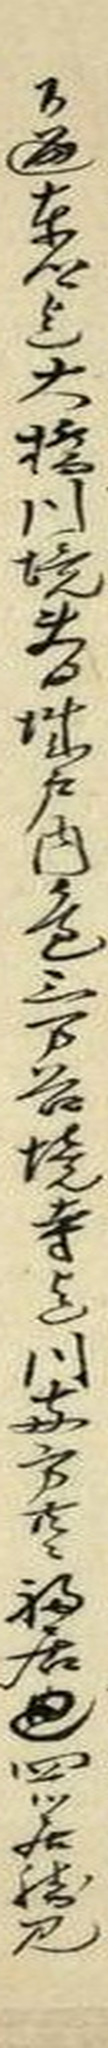下通東郷迄大橋川境夫ゟ城戸内辺三万谷境寺迄川両方共ニ福居廻四ツ居勝見
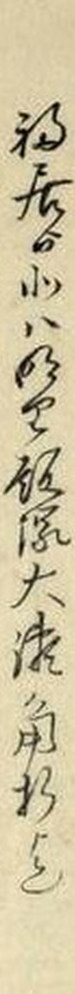福居ゟ北ハ明里飯塚大瀬角折迄
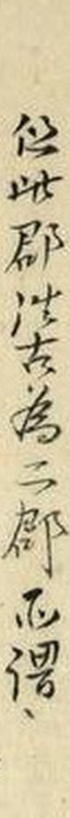但此郡往古為二郡所謂
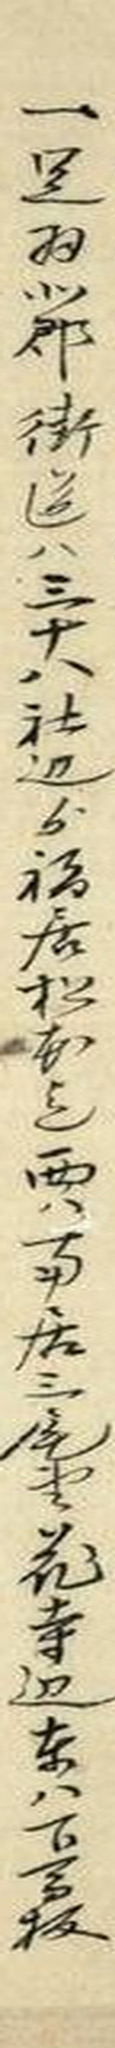一足羽北郡街道ハ三十八社辺ゟ福居松本迄西ハ南居三尾野花寺辺東ハ下馬板
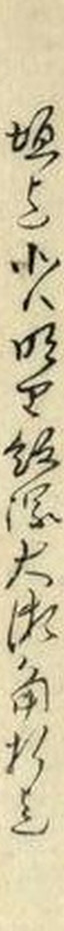垣迄北ハ明里飯塚大瀬角折迄
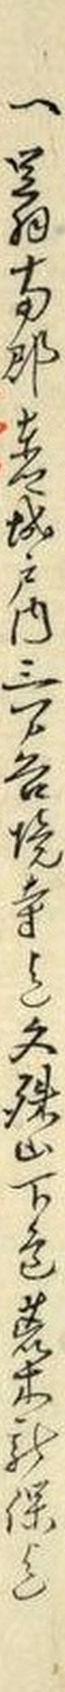一足羽南郡東郷城戸内三万谷境寺迄文珠山下辺荒木新保迄
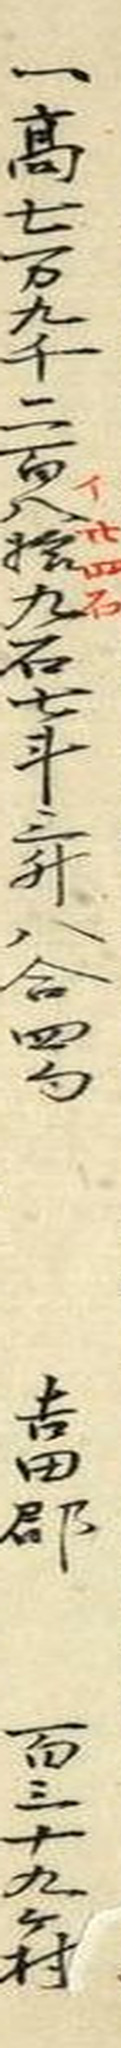一高七万九千二百八拾九石七斗三升八合四勺吉田郡百三十九ケ村
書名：御国他国諸事之部
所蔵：福井県文書館 Fukui Prefectural Archives
